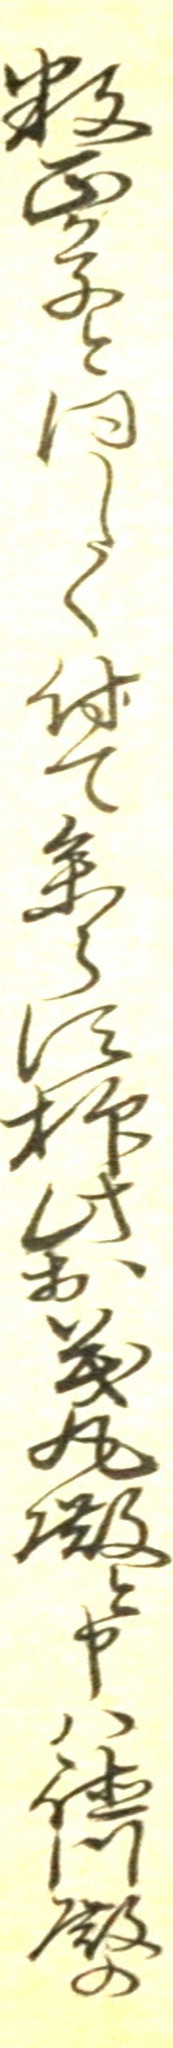数正か子と同しく付て参らす抑此お義丸殿と申は徳川殿の
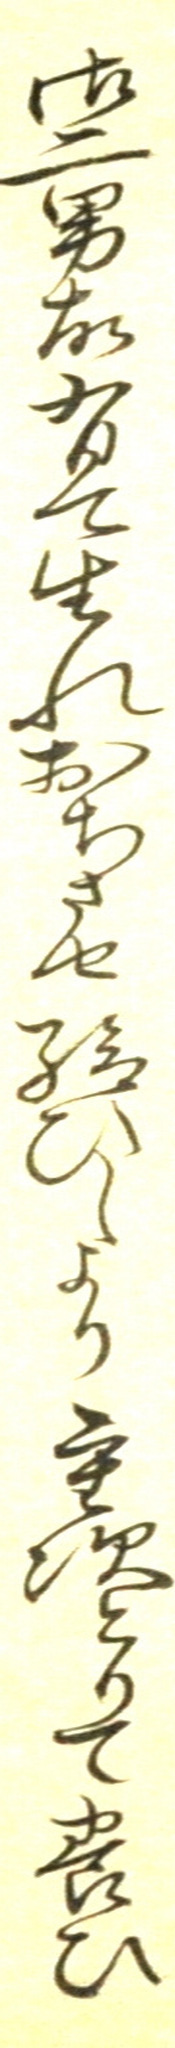御二男故有て生れおちさせ給ひしより重次とりて養ひ
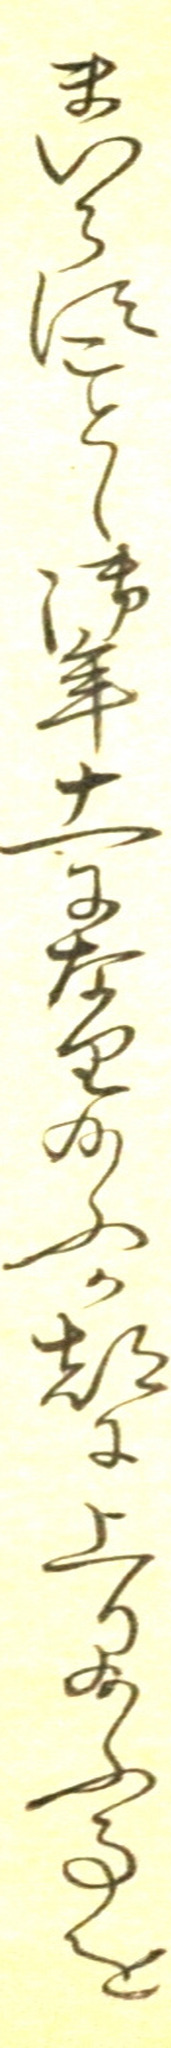まいらすことし御年十一になり給ふか都に上り給ふ事を
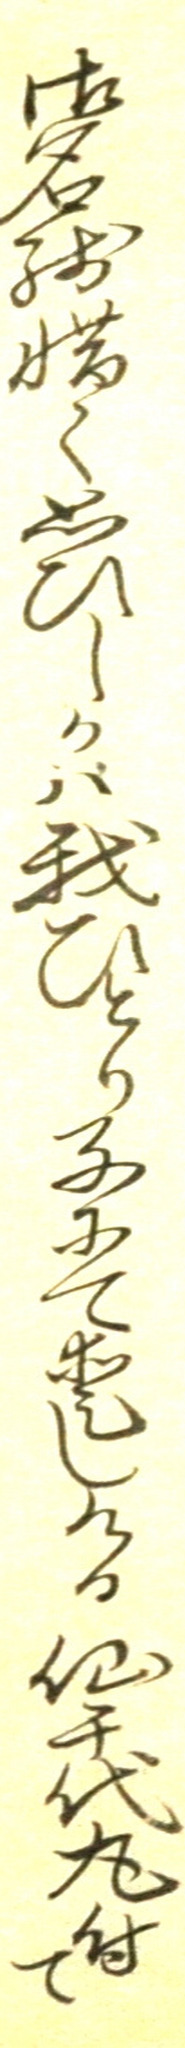御名残惜く思ひしかば我ひとり子にて愛しける仙千代丸付て
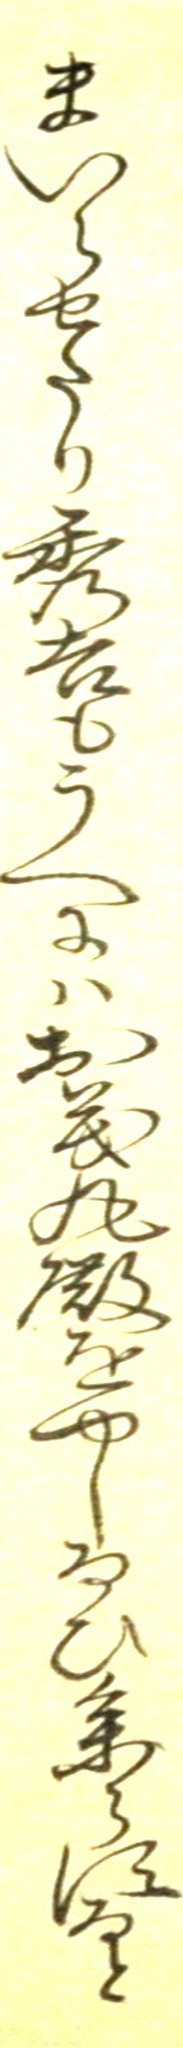まいらせたり秀吉もうへにはお義丸殿をやしなひ参らすなと
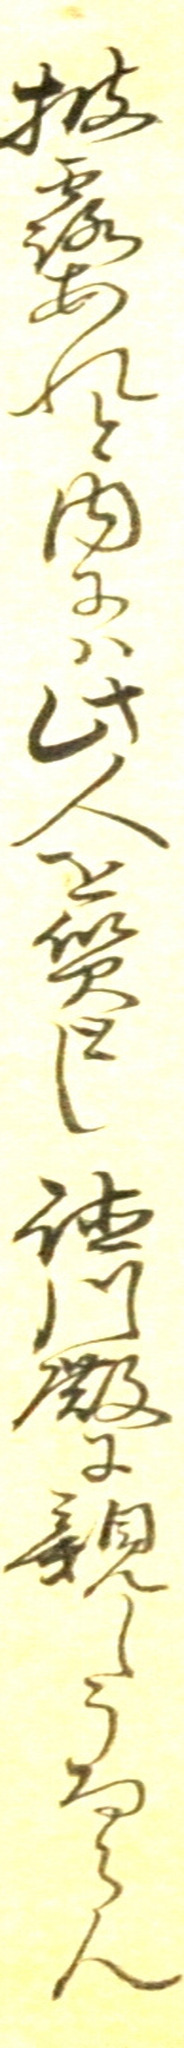披露あれと内には此人を質とし徳川殿に親しうならん

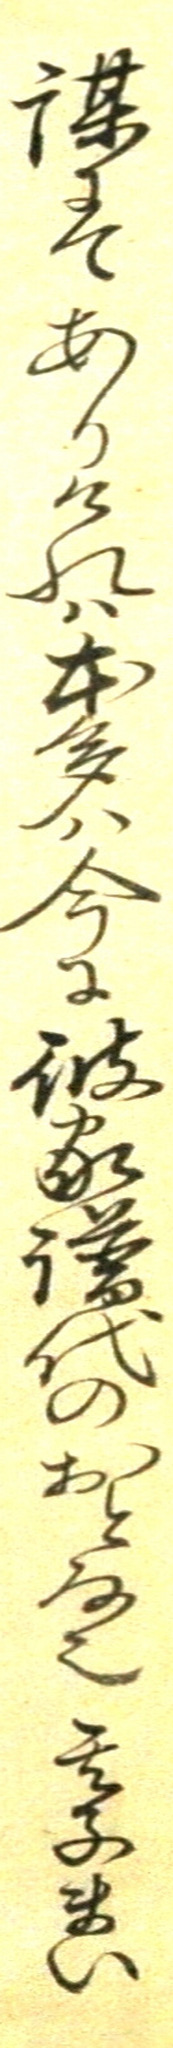謀にてありけれは本多は今に彼家普代のおとな也其子まい
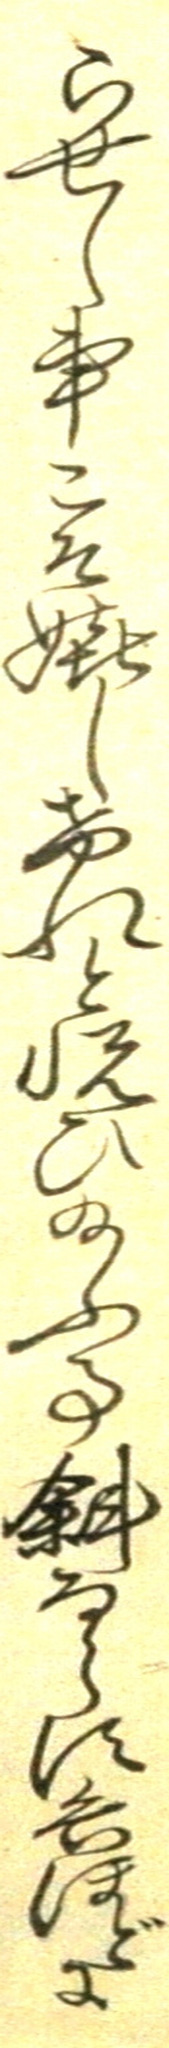らせし事こそ嬉しけれと悦ひ給ふ事斜ならす兵ほどに
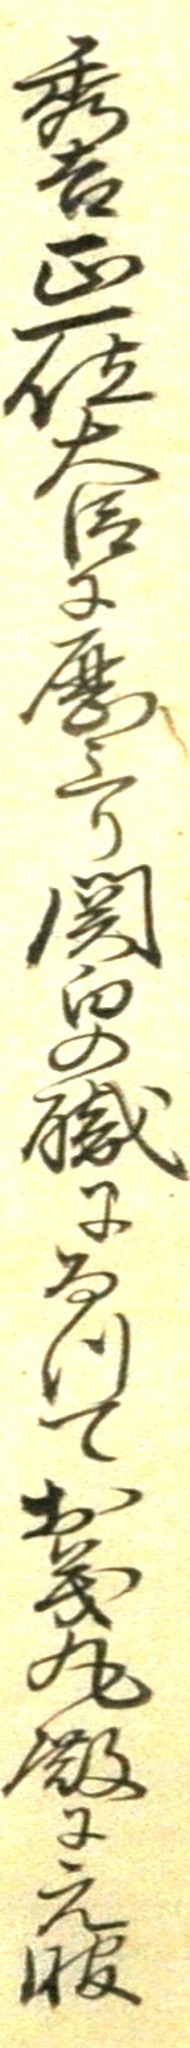秀吉正一位大臣に歴上り関白の職になつてお義丸殿に元服
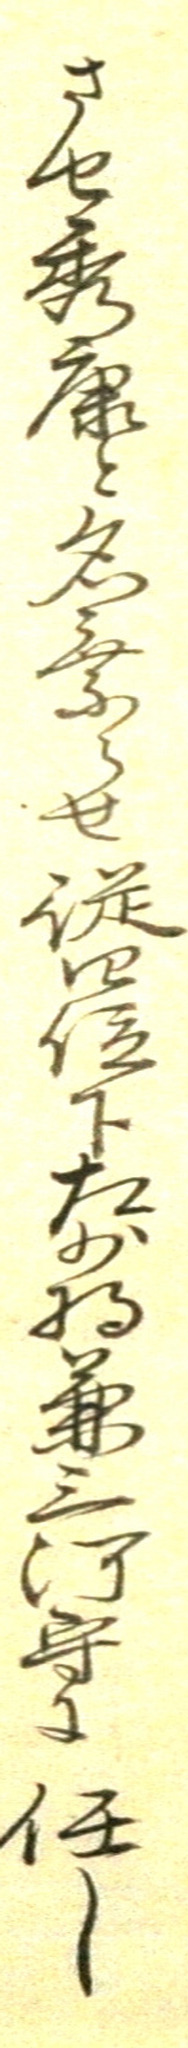させ秀康と名乗らせ従四位下左少将兼三河守に任し
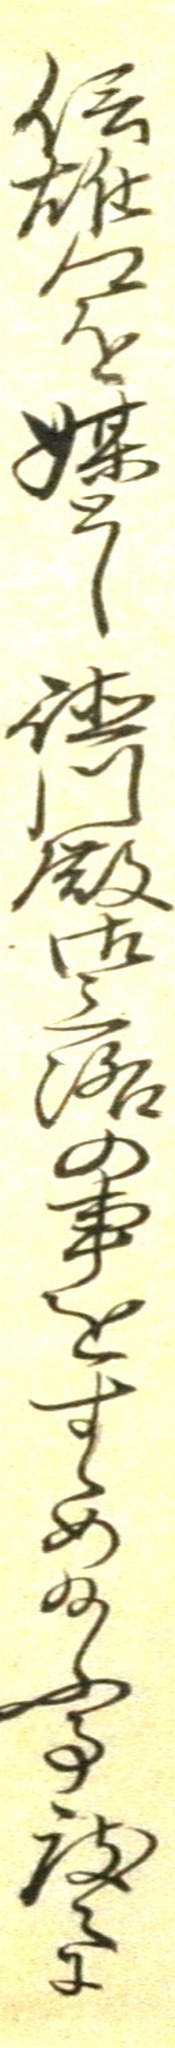信雄卿を媒とし徳川殿御上洛の事をすゝめ給ふ事度々に
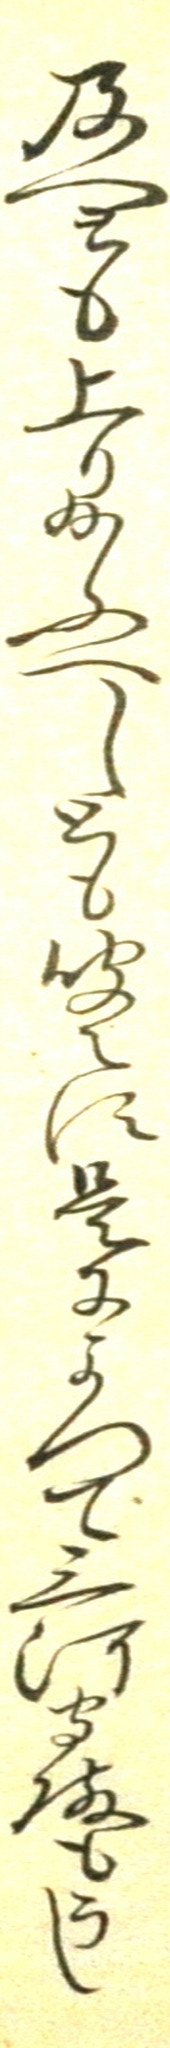及へとも上り給ふへしとも聞えす是によつて三河守殿もうし
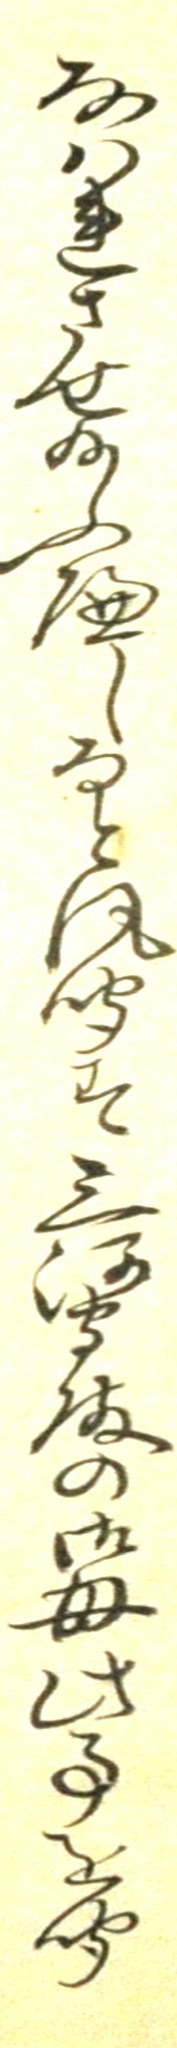なはれさせ給ふへしなと風聞す三河守殿の御母此事を聞
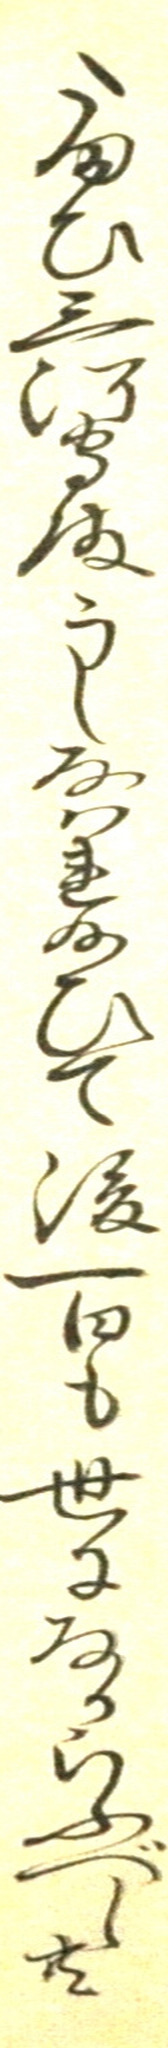たまひ三河守殿うしなはれ給ひて後一日も世になからふべし共
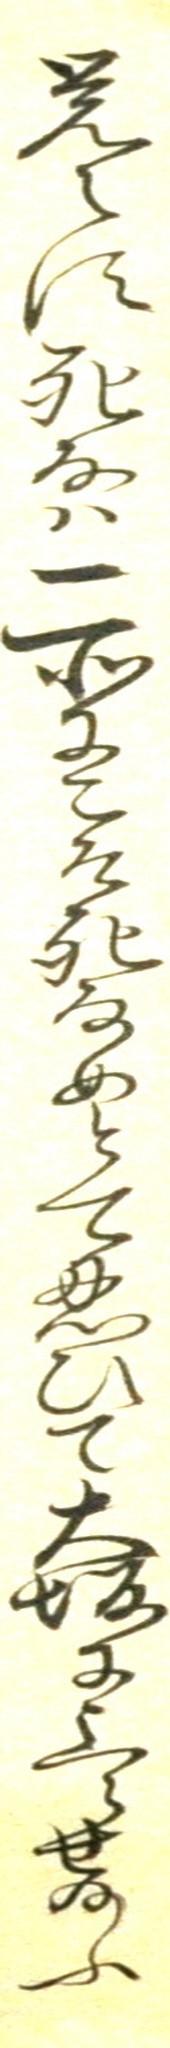覚えす死なは一所にこそ死なめとて忍ひて大坂に上らせ給ふ
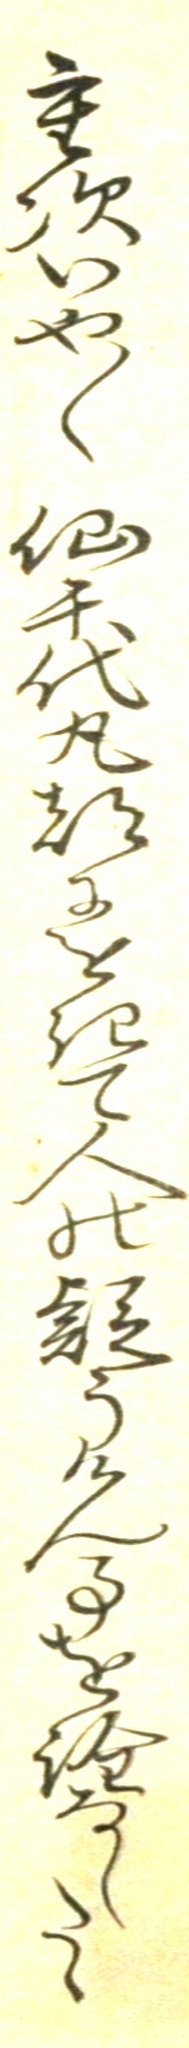重次いや〳〵仙千代丸都にをきて人の疑うけん事を詮なしたゝ
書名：藩翰譜（四・上）
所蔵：伊那市立高遠町図書館・合同会社AMANE
